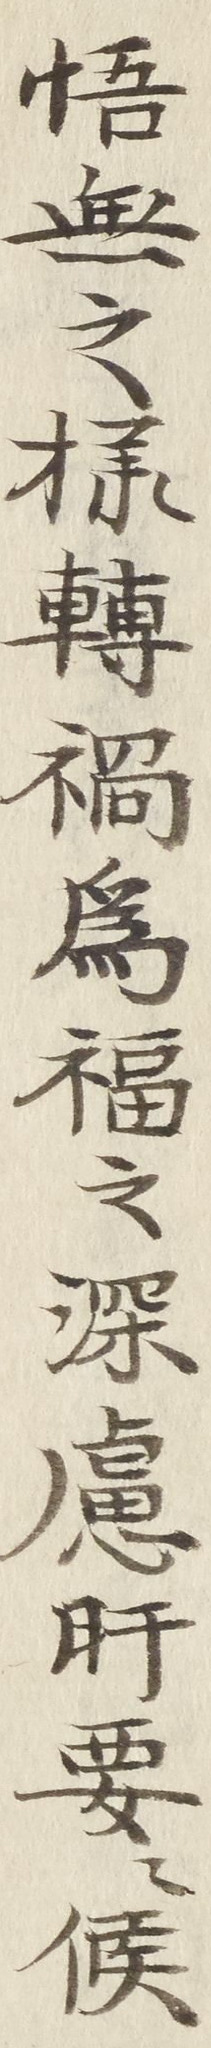悟無之様転禍為福之深慮肝要ニ候乍恐
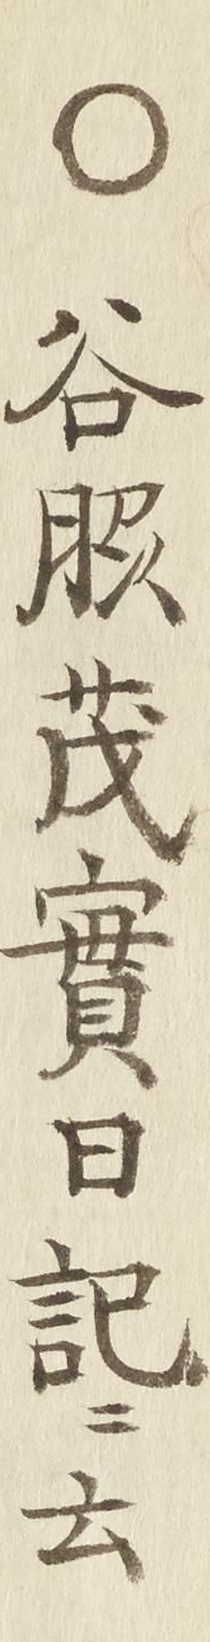〇谷脇茂実日記ニ云
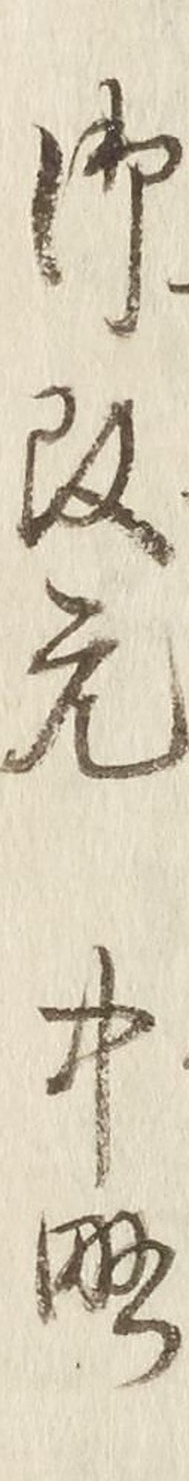御改元中略
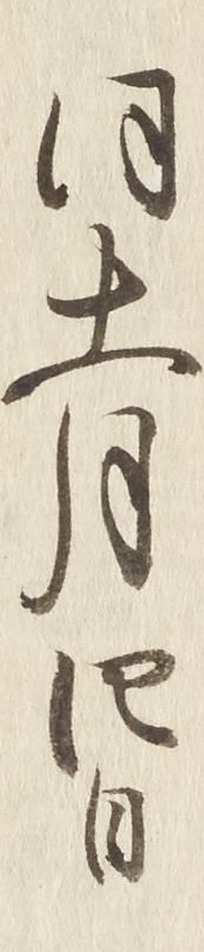同十一月四日
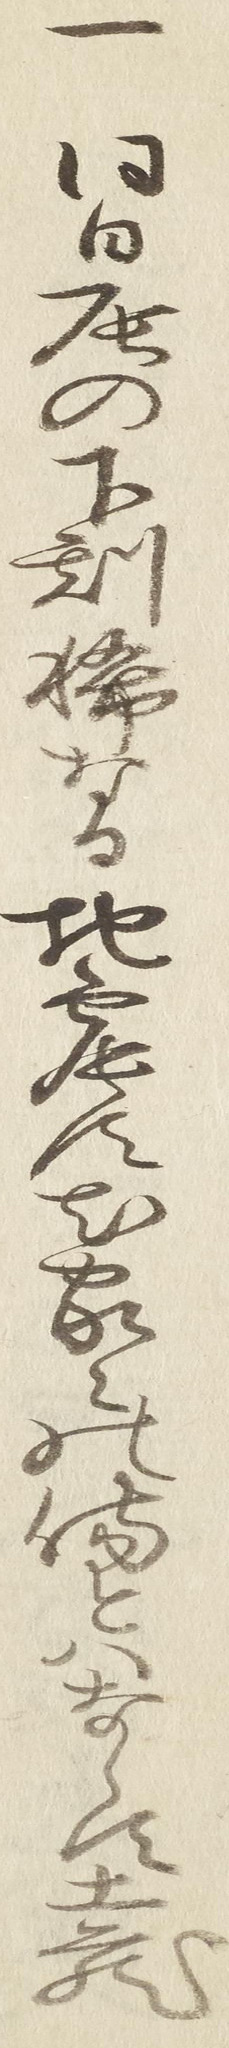一同日辰の下刻稀なる地震す尤家々の傷とはならす土蔵
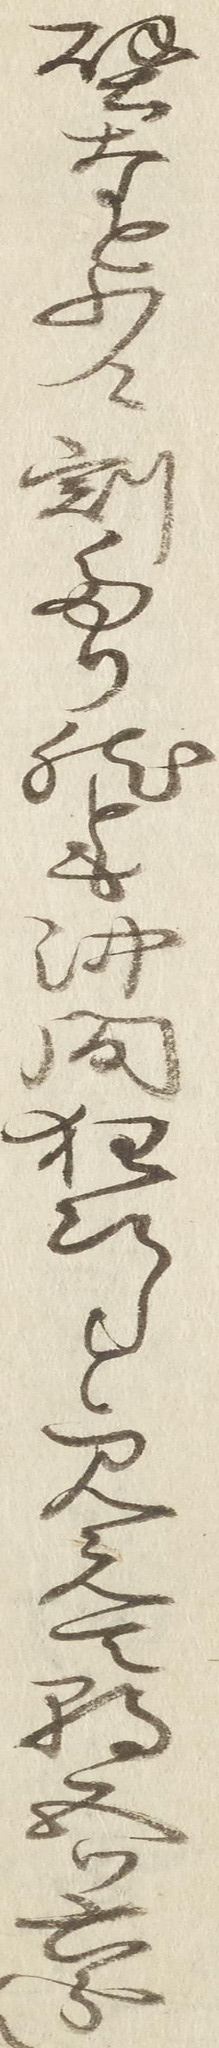壁など少々割たり然とも沖間狂ひしと見えて朝五ツ六分之
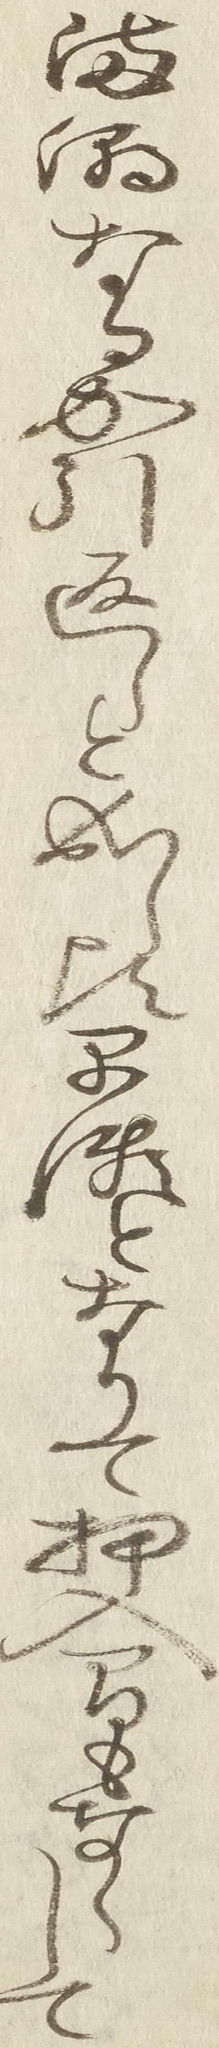満潮なるが引返しと成し頃早瀬となりて押入間もなくして
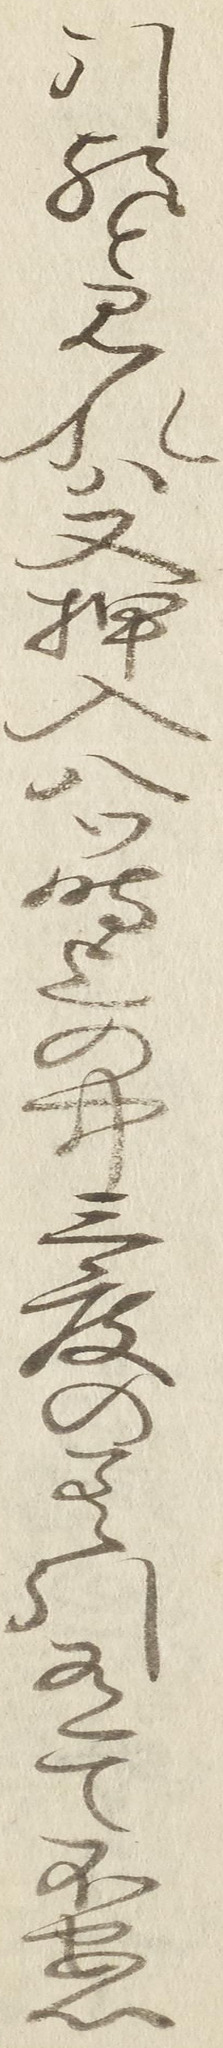引歟と見れば又押入八ツ時迄の中三度の差引有て不安心に
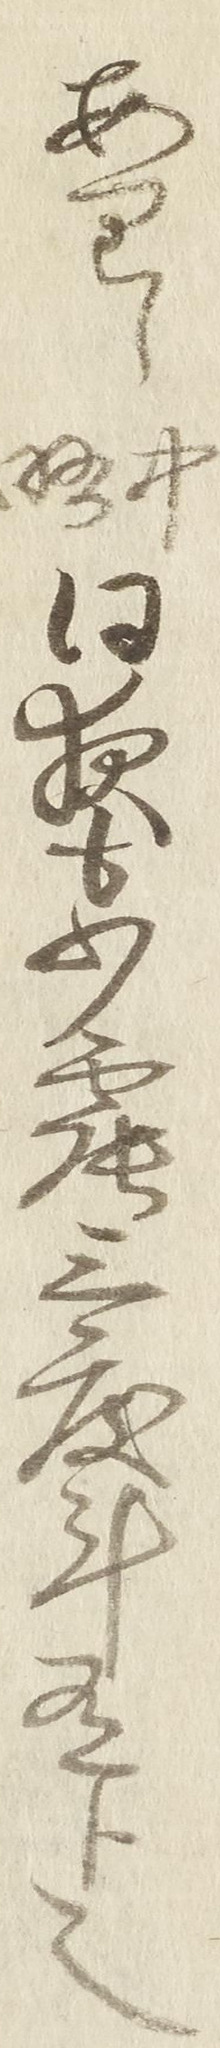ありし中略同夜も少震三度斗有之也
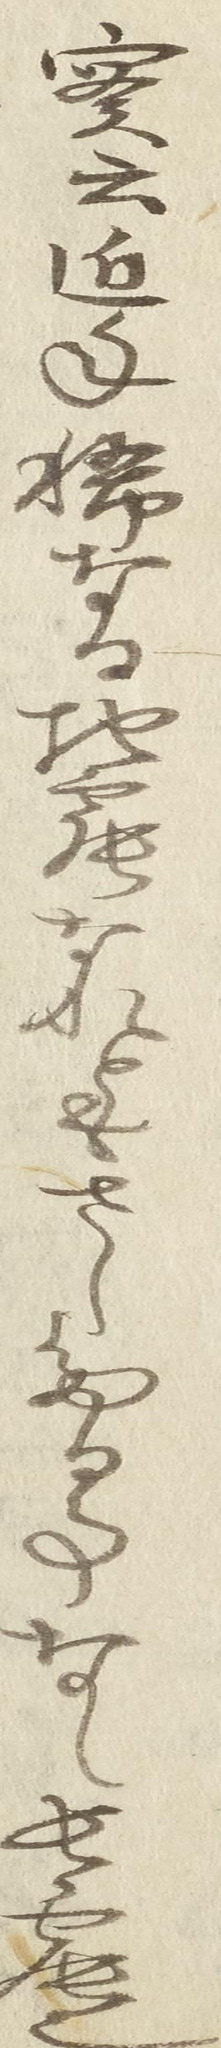実云近年稀なる地震なれともさしたる事なし長震也
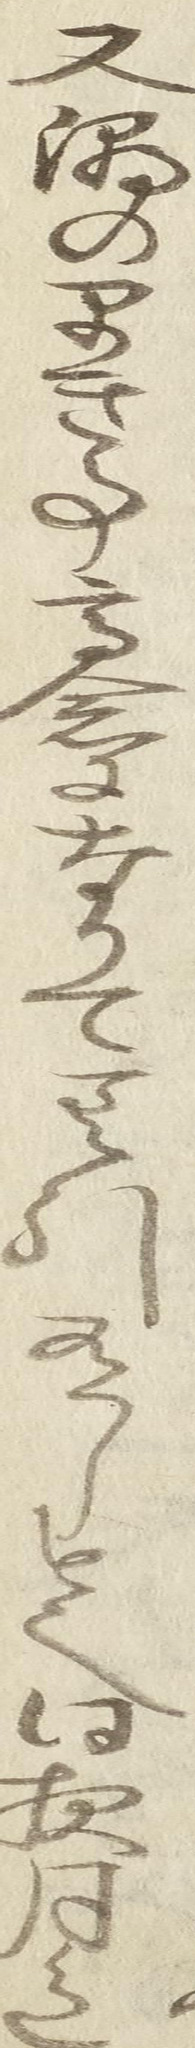又潮の早き事高倉になりて差引有しと也同夜月色
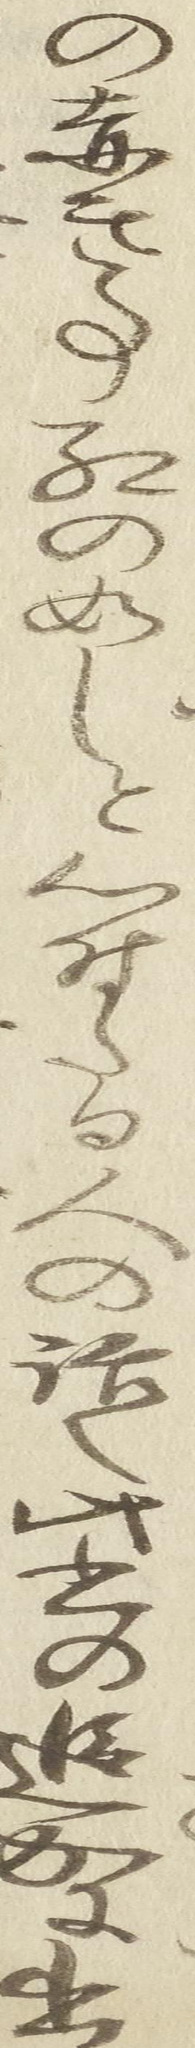の赤き事紅の如しと心付たる人の話也此書の追加に出
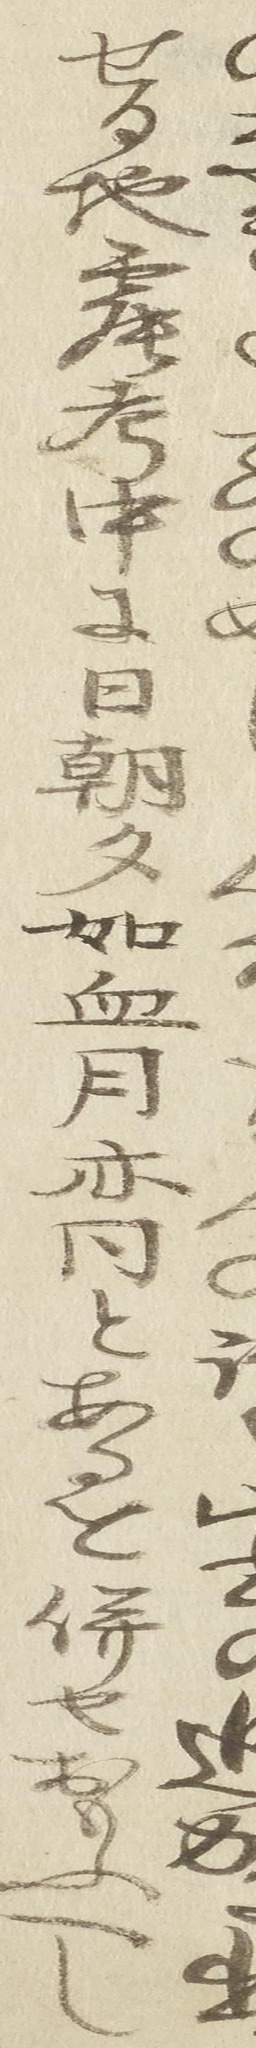せる地震考中に日朝夕如血月亦同とあるを併せおもふへし

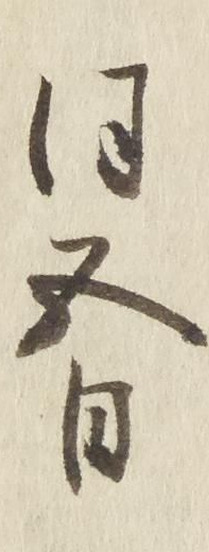同五日
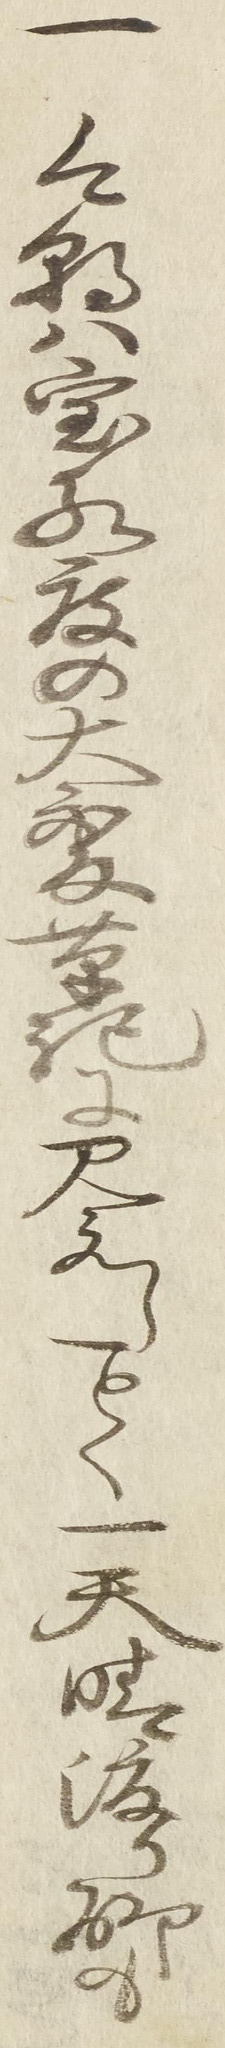一今朝ハ宝永度の大変筆記に見えしことく一天晴渡り聊も
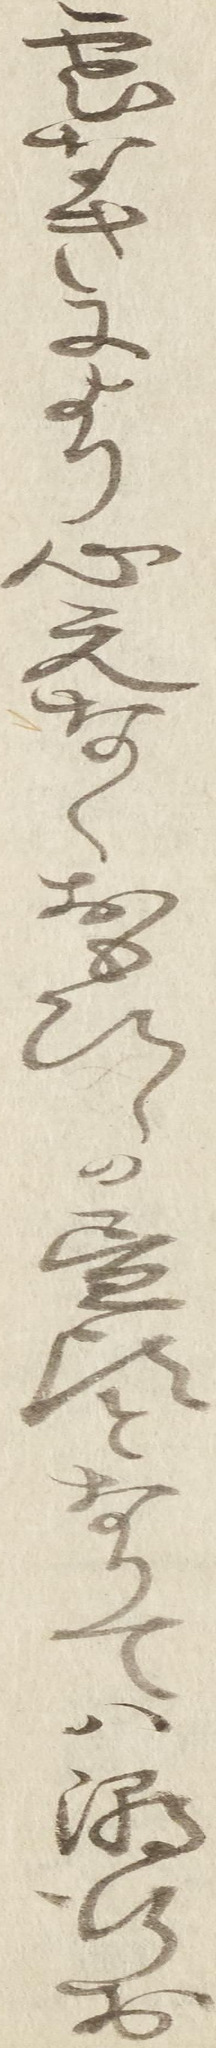雲なきにより心元なくおもひの昼頃となりては潮行お
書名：地震記　上
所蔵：東京大学地震研究所図書室 Earthquake Research Institute Library, The University of Tokyo, JAPAN
